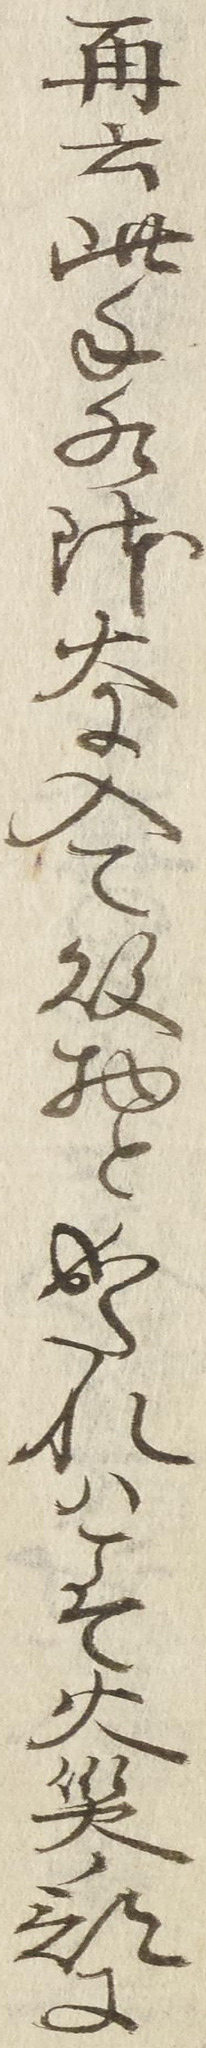再云此手水鉢火に入て故物と成たれはさて火災の部に
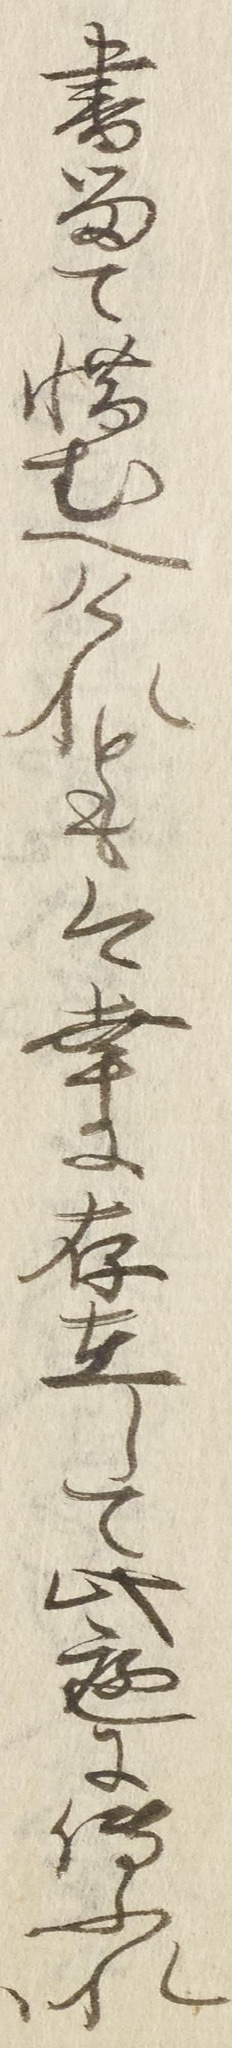書留て惜むへけれとも今幸に存在して此庭に伝ふれは
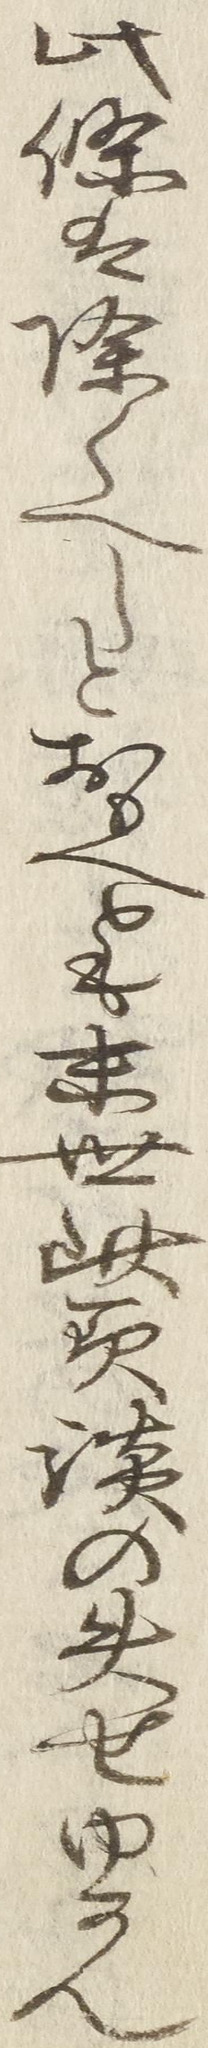此条は除くへしとおもへとも末世此美談の失せゆかん
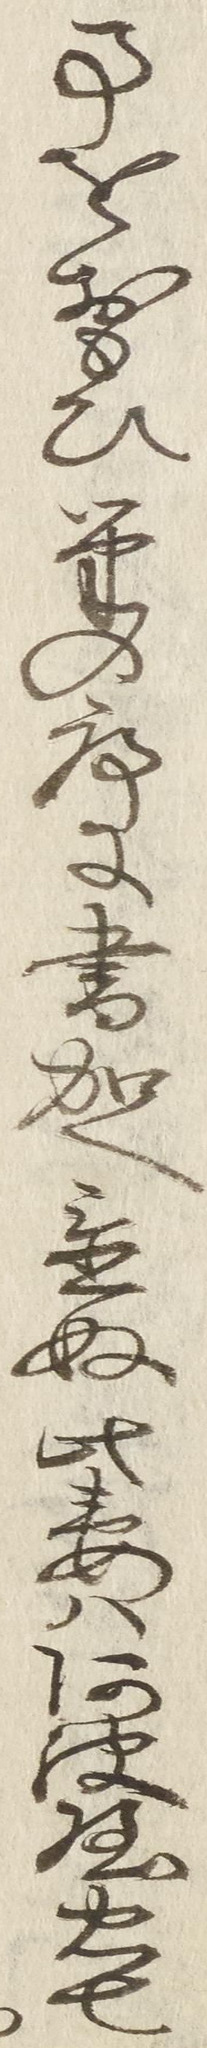事をおもひ筆の序に書加へ置ぬ此妻は阿波屋忠七か
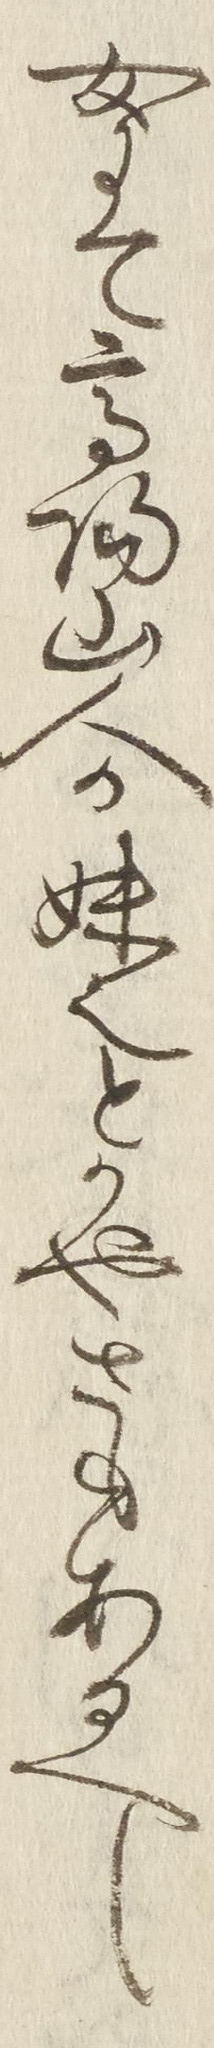女にて高陽山人か妹也とかやさもあるへし
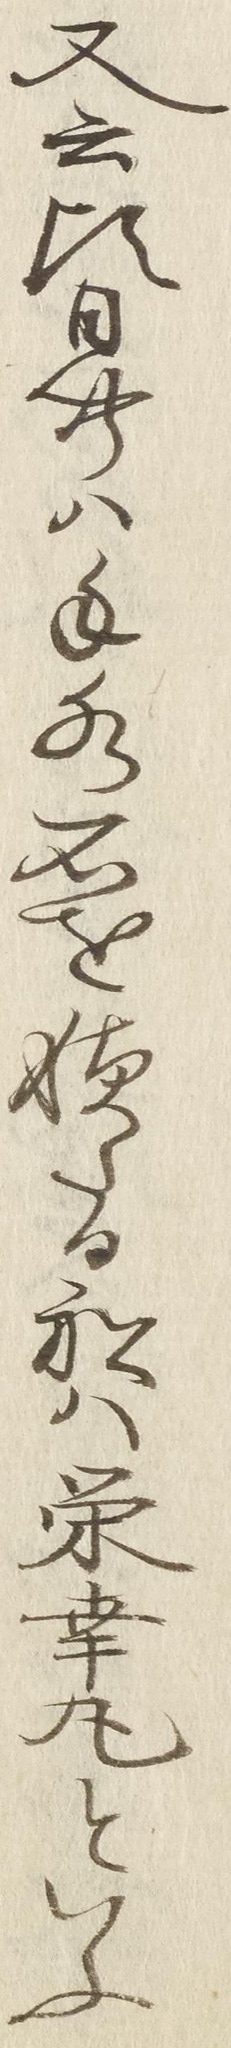又云頃日聞は手水石を積たる船は栄幸丸といふ
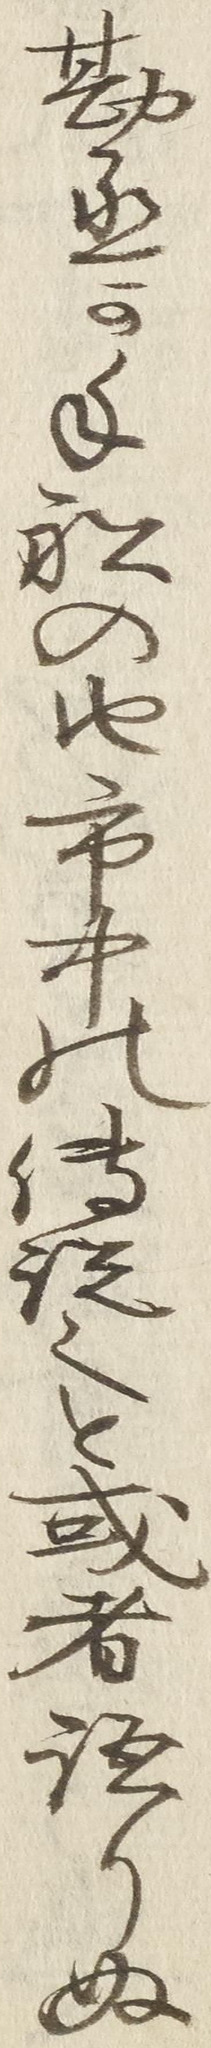勘丞か手船の由市中の伝説也と或者語りぬ
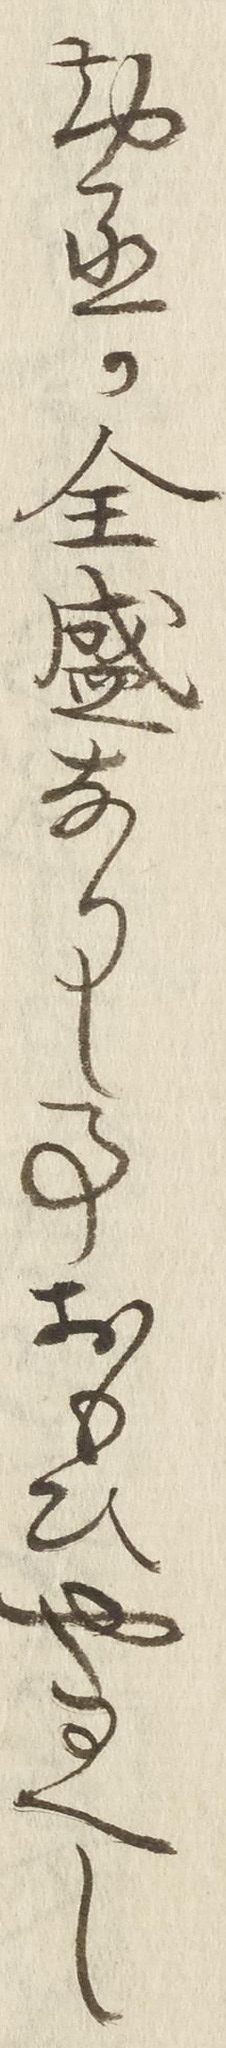勘丞か全盛なりし事おもひやるへし
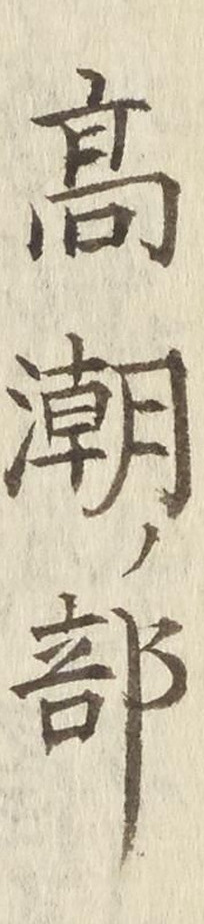高潮の部
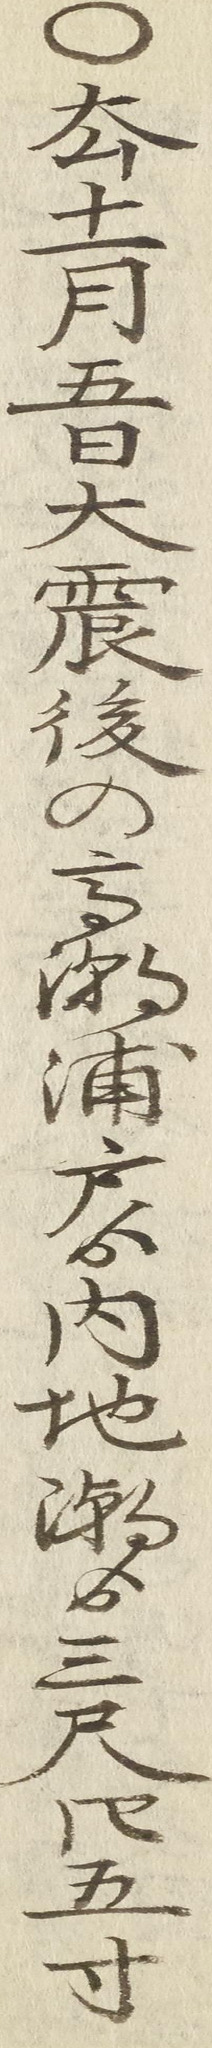〇去十一月五日大震後の高瀬浦戸より内地潮より三尺四五寸
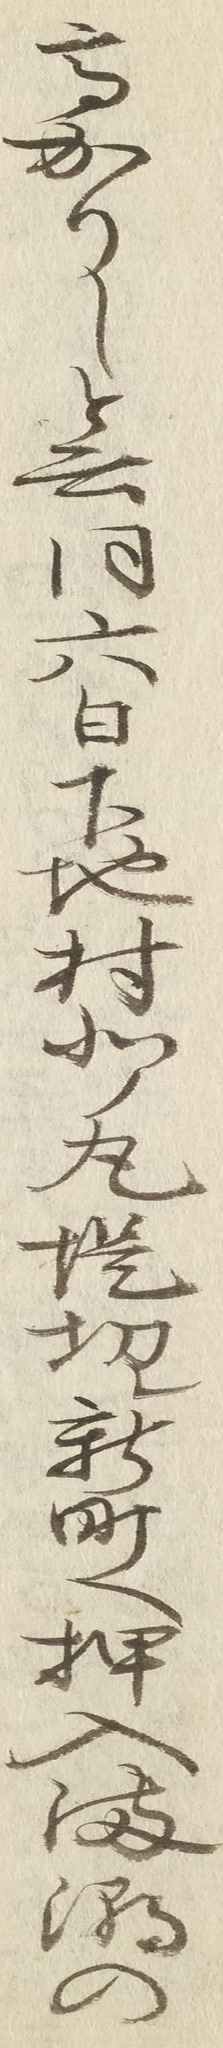高かりしと云同六日下地村北の丸堤切れ新町へ押入満潮の
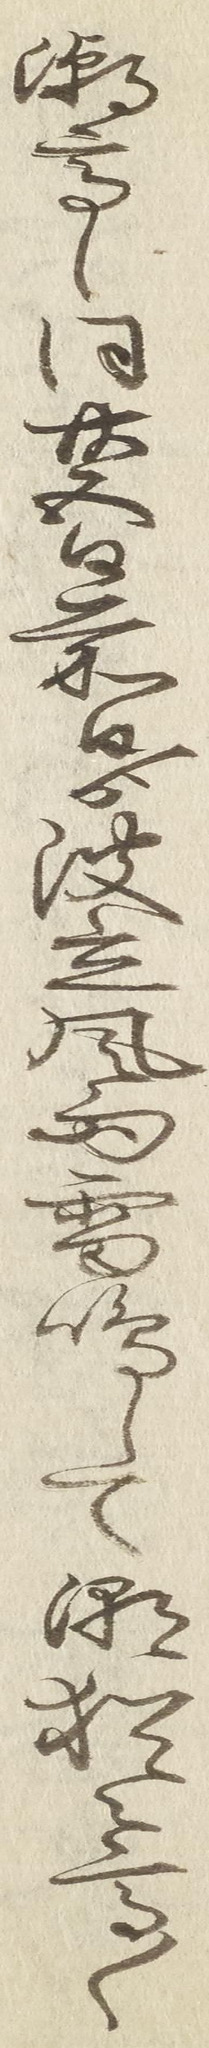潮高し同廿五日前日より波立風雨雷鳴して潮猶々高く
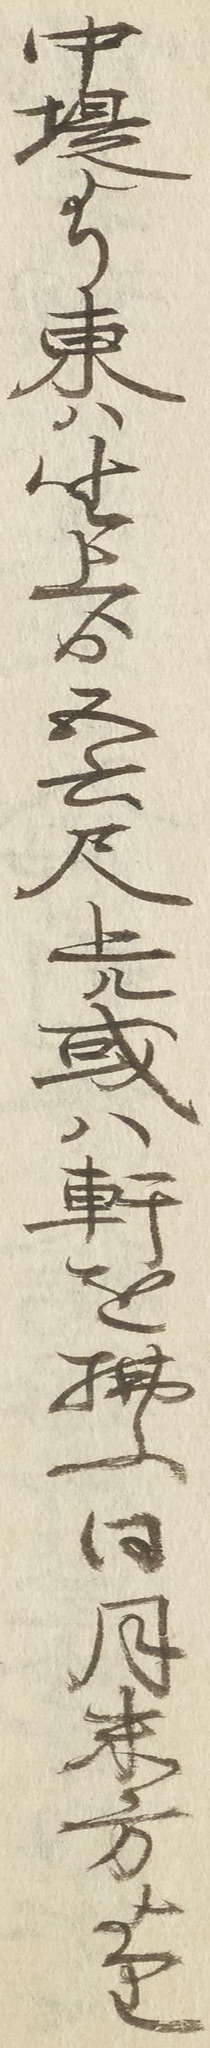中堤より東は座上より五六尺上る或は軒を払ふ同月末方より
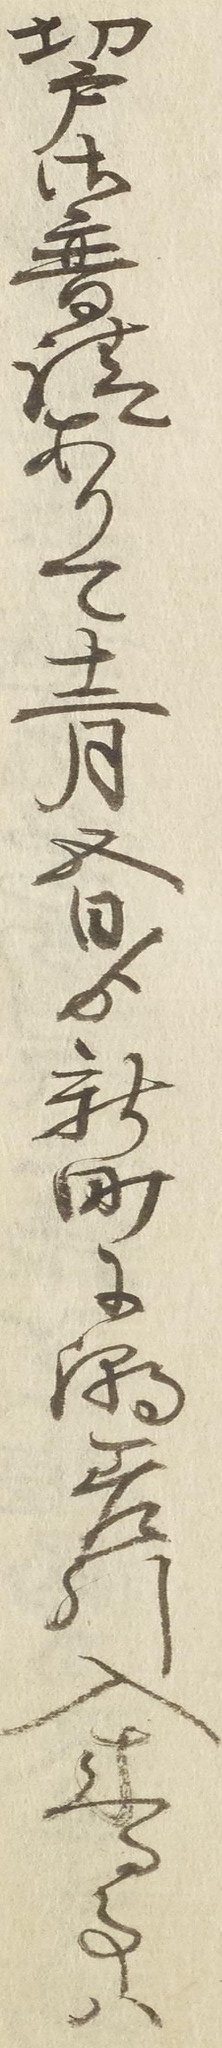切戸御普請ありて十二月五日より新町に潮差引入来る事は
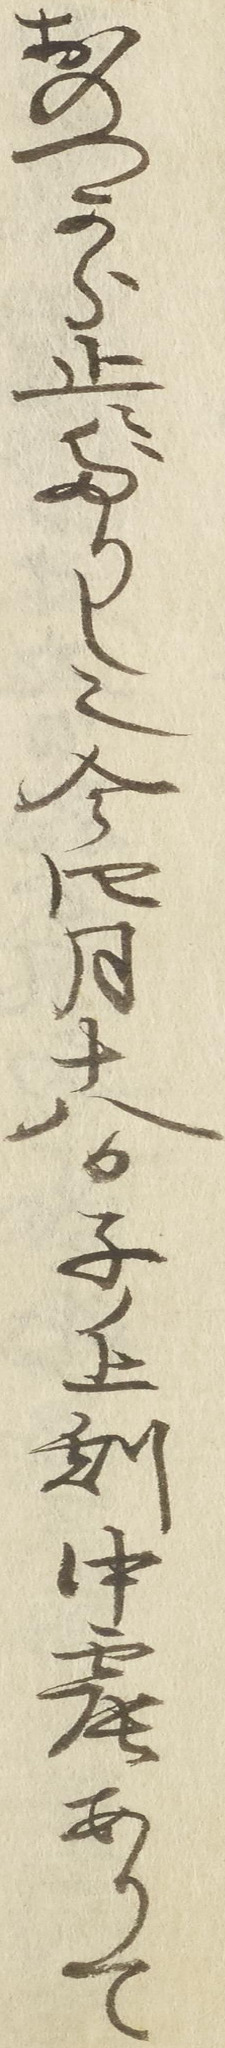おのつから止みたりし也今四月十八日子の上刻中震ありて

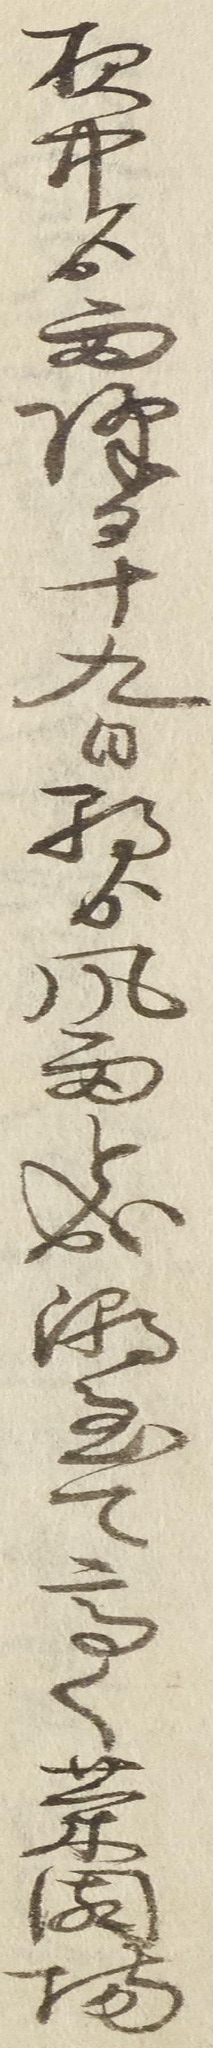夜中より雨降る十九日朝より風雨と成潮至て高く菜園場
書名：地震記　上
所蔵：東京大学地震研究所図書室 Earthquake Research Institute Library, The University of Tokyo, JAPAN
